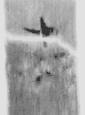{十四}
